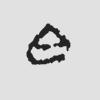白
